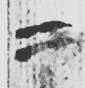二
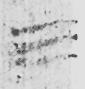三
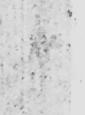十
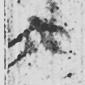六
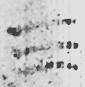三
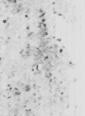十
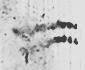二
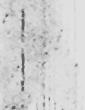十
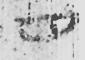四
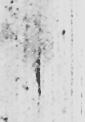十
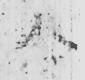八
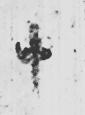十
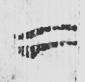二
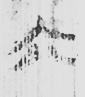六
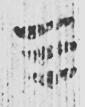三
